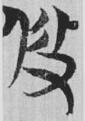攸（修）
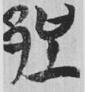郢
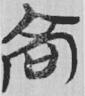高（郊）
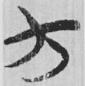方
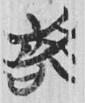若
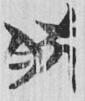○（然）
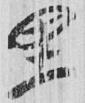里
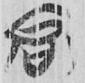君
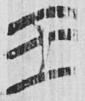王
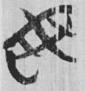母（毋）
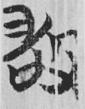敢
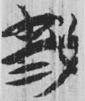○（災）
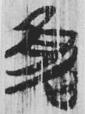害
